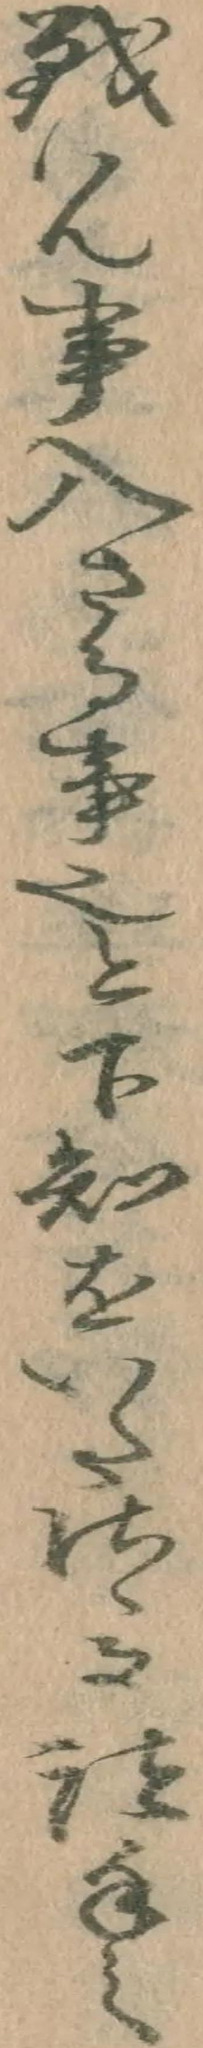戦はん事入さる事也と下知をいた佐々る諸手之
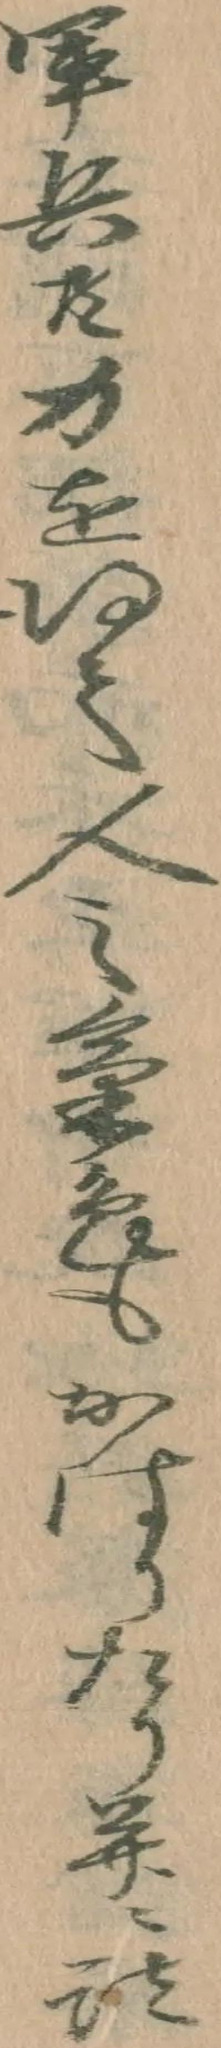軍兵共力を得て人之気色もかはりたり幷に諸
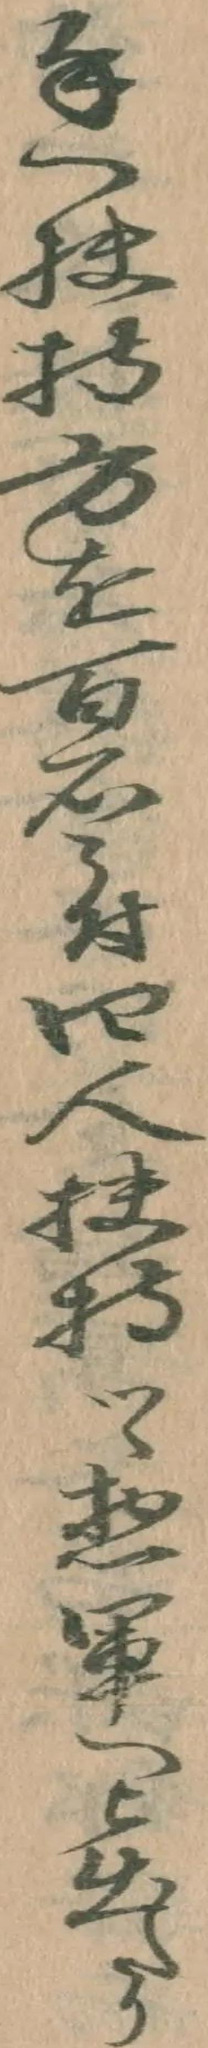手へ扶持方を百石に付四人扶持つゝ惣軍へ被出たり
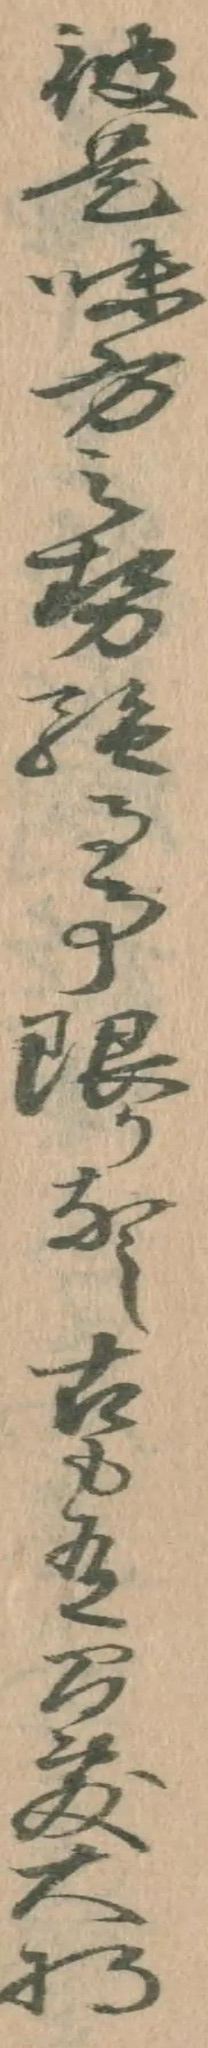彼是味方之勢絶る事限りなし古も有間敷大将
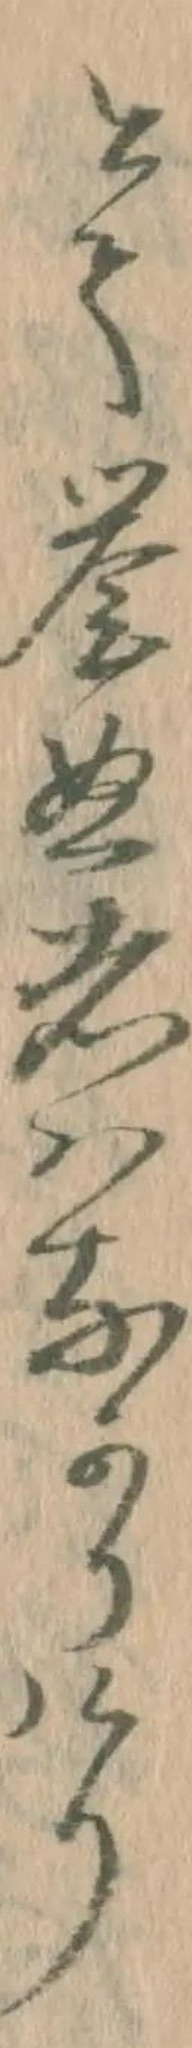とて誉怒者はな可りけり
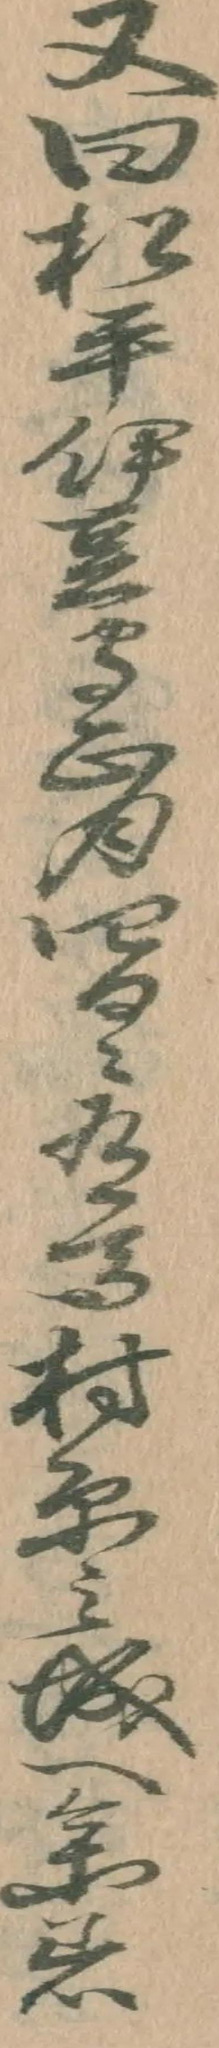又曰松平伊豆守正月四日に有馬村原之城へ参着
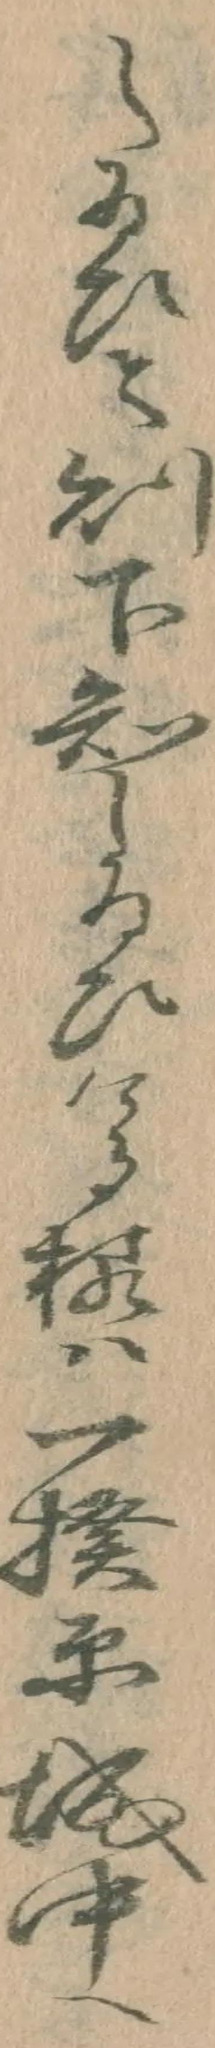し尓ひて則下知しゐひける様は一揆原城中へ
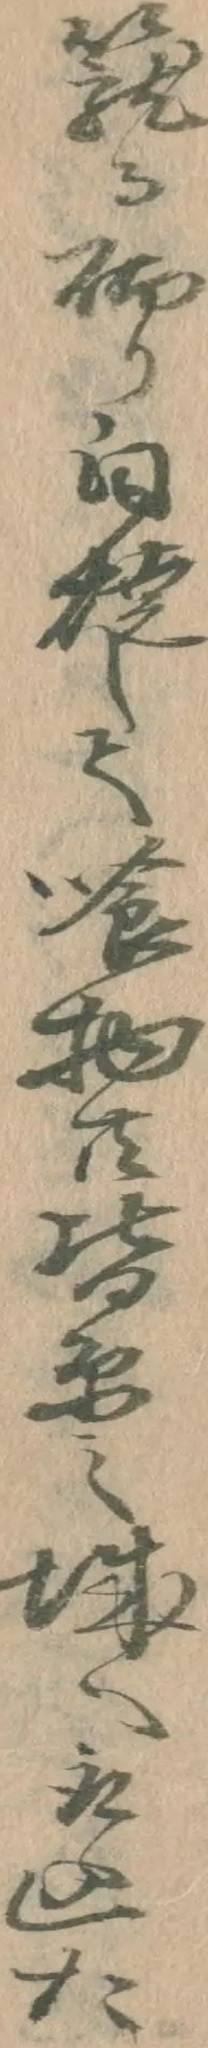籠る砌り自焼して喰物共皆原之城へ取込た
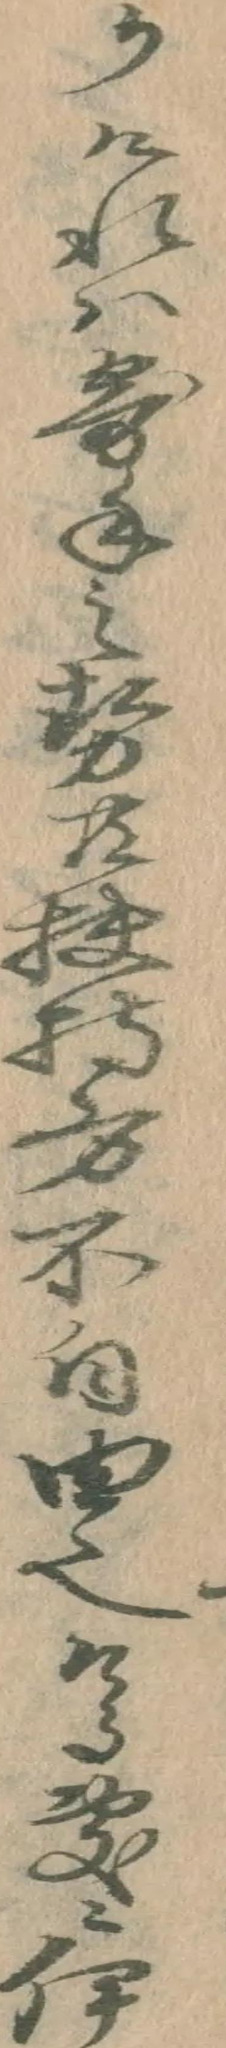りけれは寄手之勢共扶持方不自由也ける處に伊
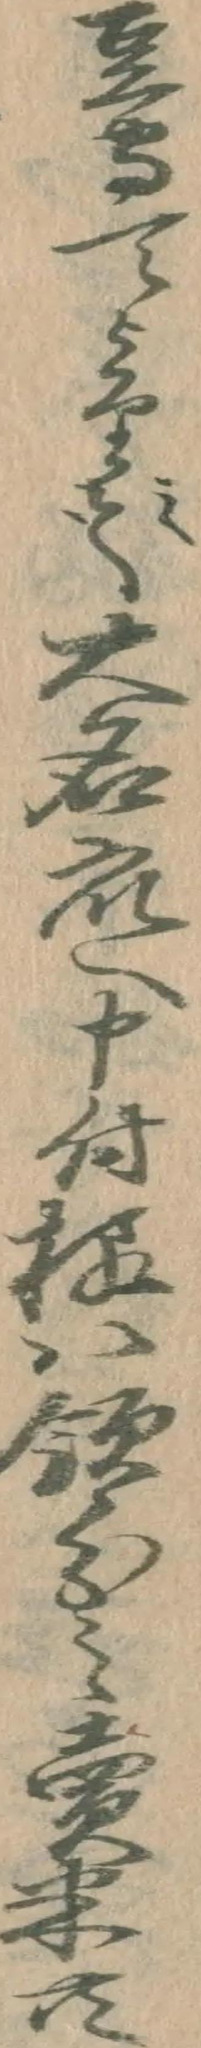豆守天与里之大名衆へ申付様は領分之買米共
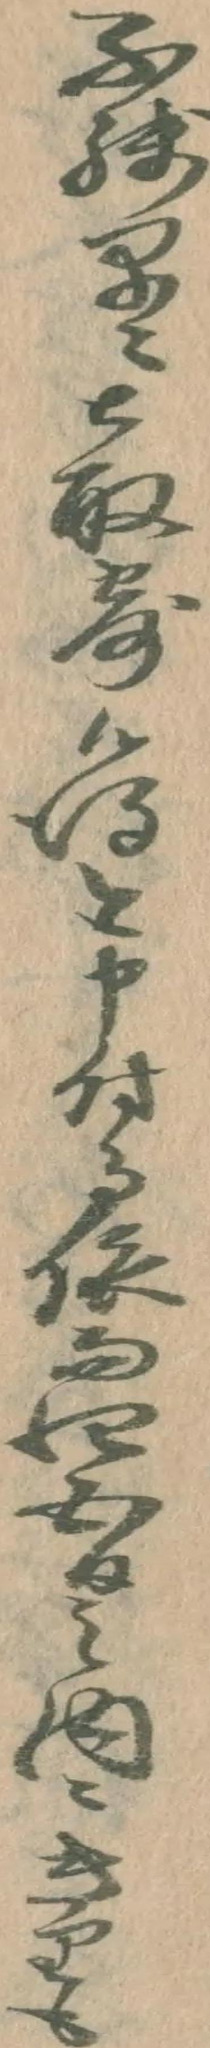ふ残早々被取寄候得と申付る依而四五日之内にき里も
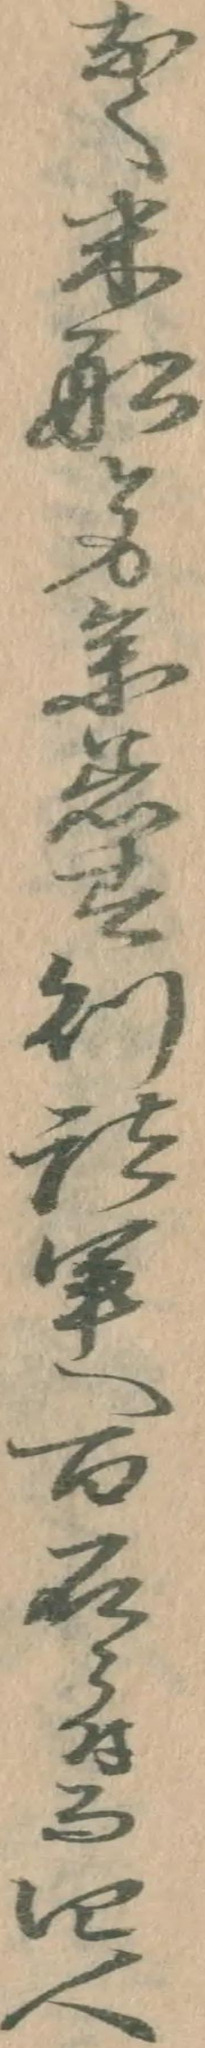なく米舩とも参着春則諸軍へ百石に付而四人
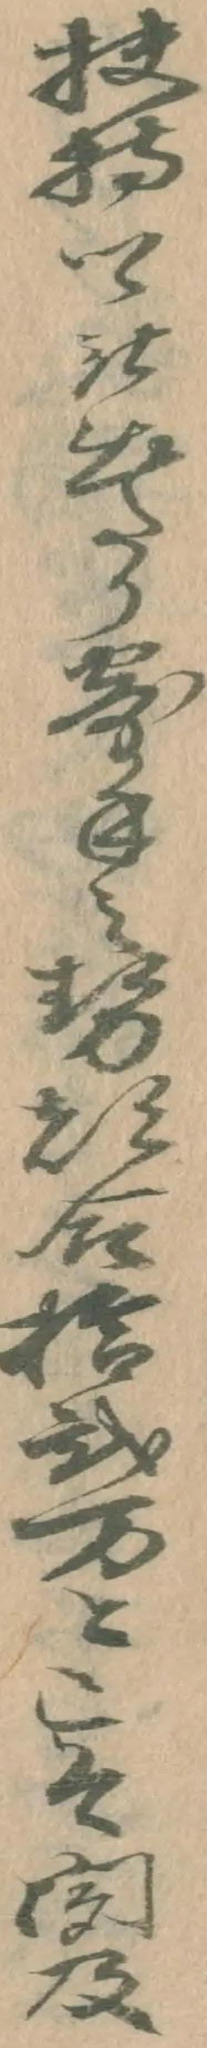扶持つゝ被出たり寄手之勢都合拾弐万とこそ聞く及

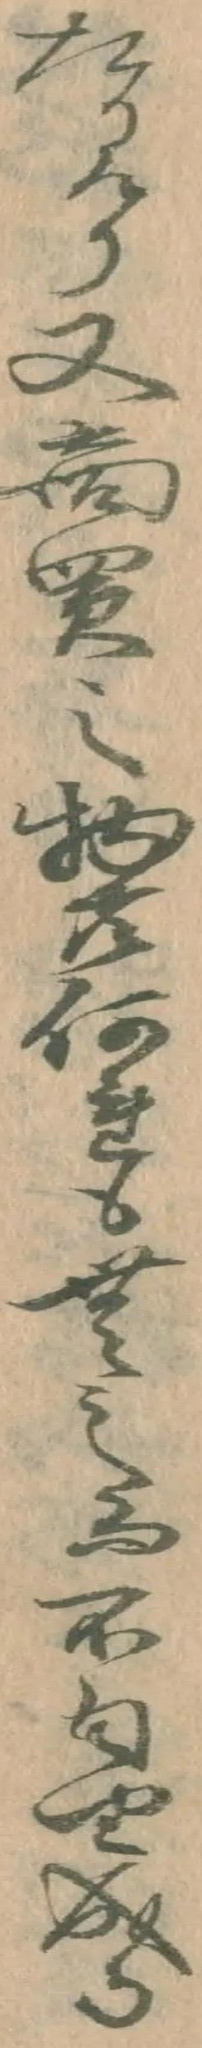たりけり又商買之物共何連も無之而不自由成る
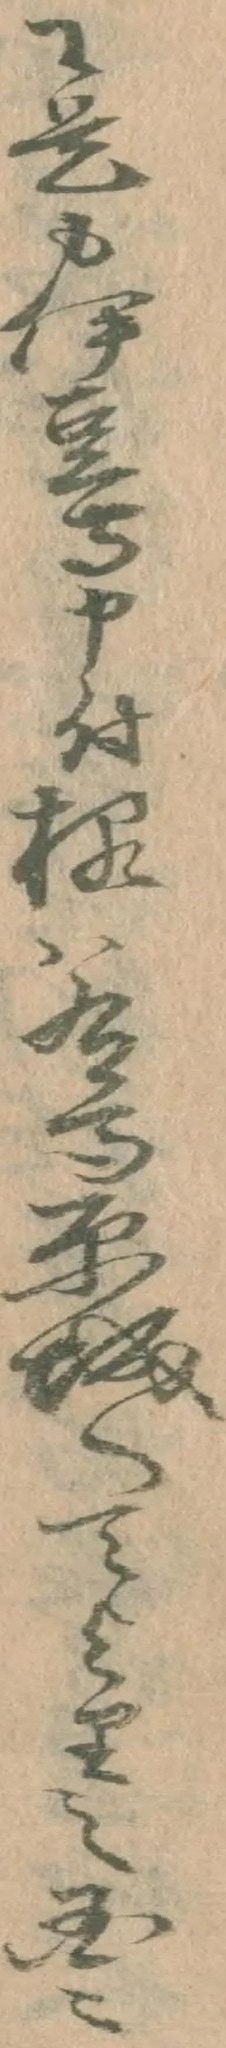尓是も伊豆守申付様は有馬原城へ天与里之国々
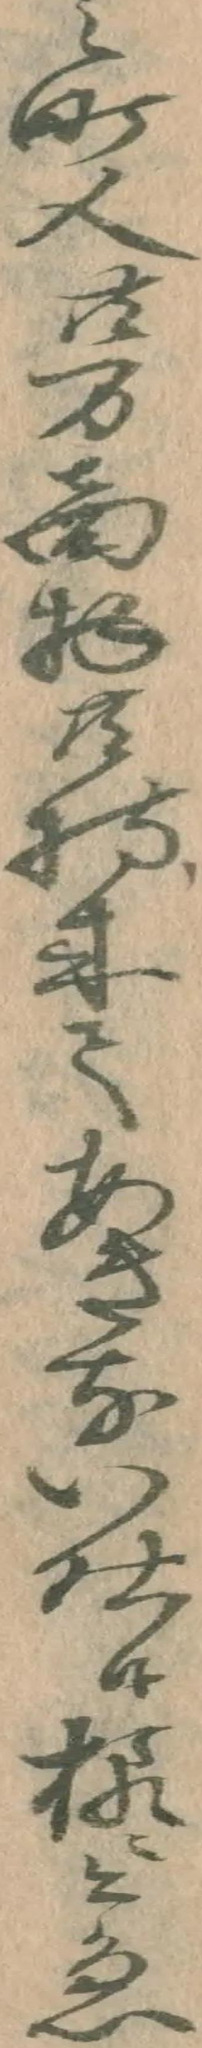之町人共万商物共持参てあきない仕候様にと急
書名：切支丹御退治記 49巻. [5]
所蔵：国立国会図書館 National Diet Library, JAPAN
